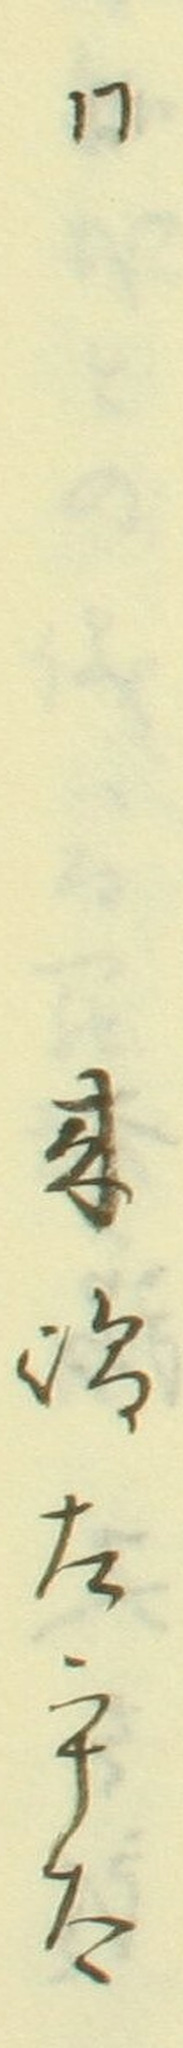同來嶋左平太
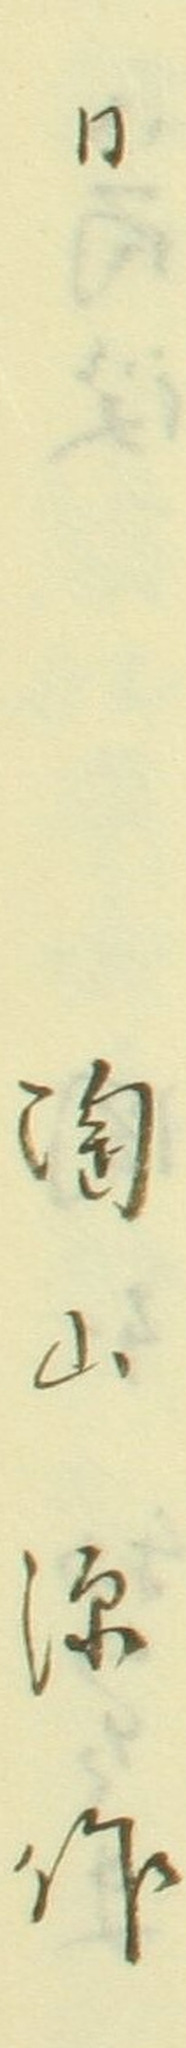同陶山源作

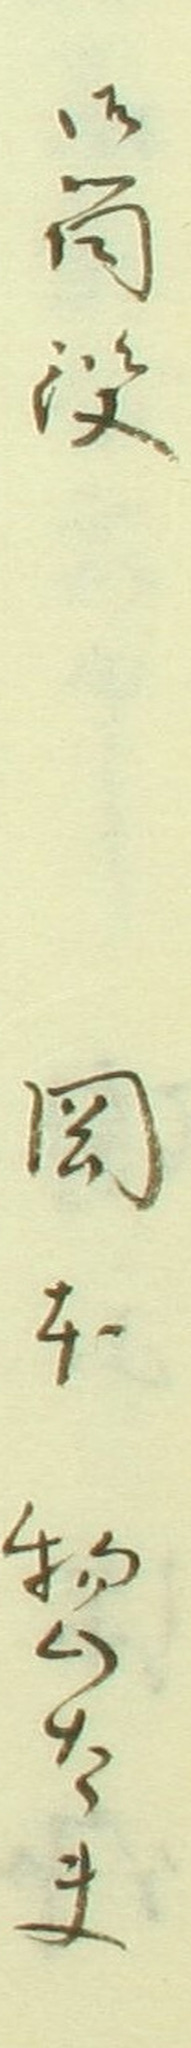御筒役岡本惣太夫
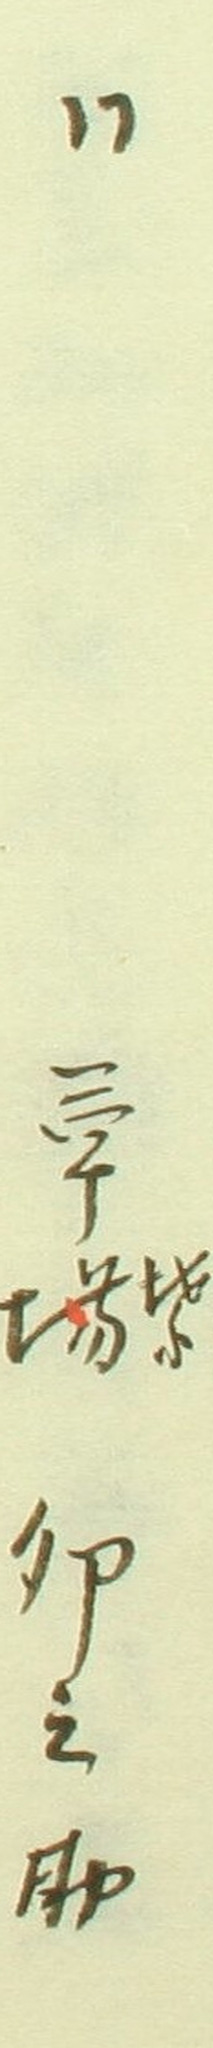同三？場卯之助
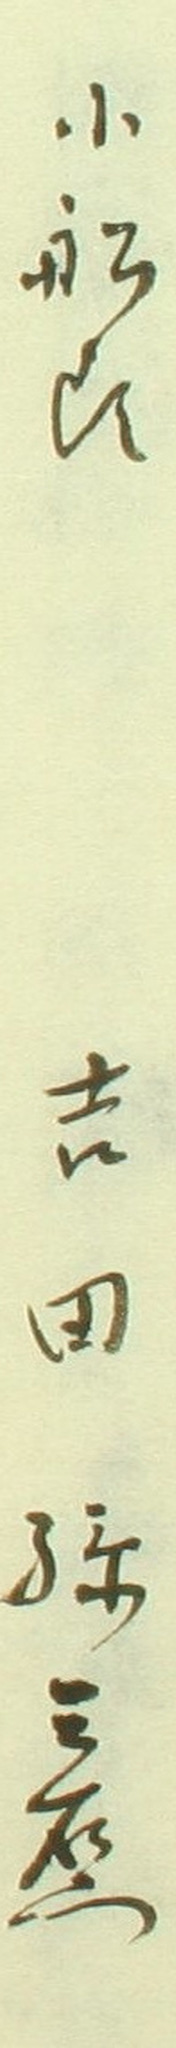小船頭吉田弥三右衛門
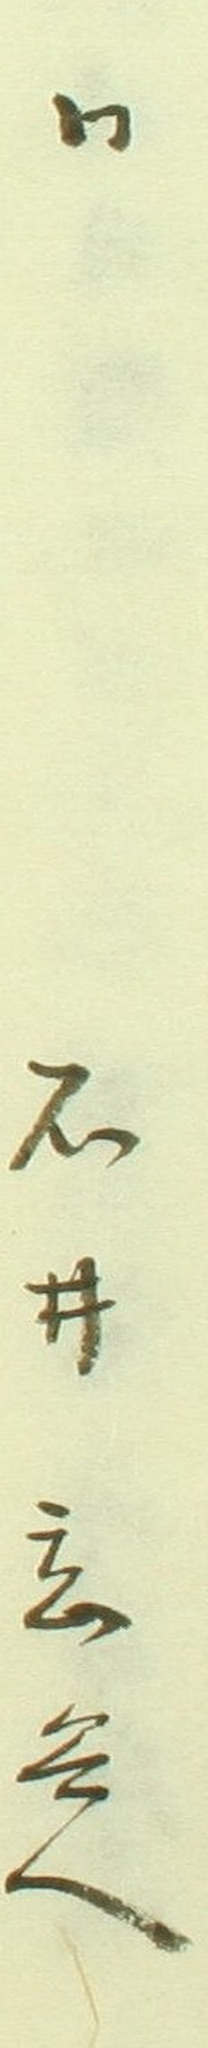同石井玄兵衛
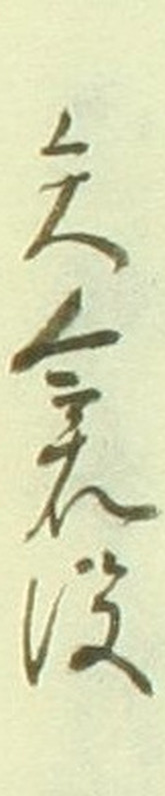矢倉役
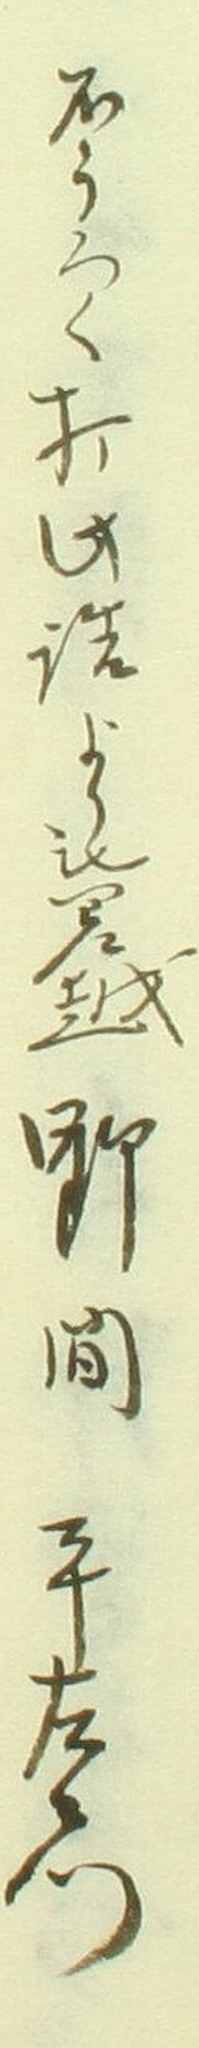不うろく打此詰より被差越野間平左衛門
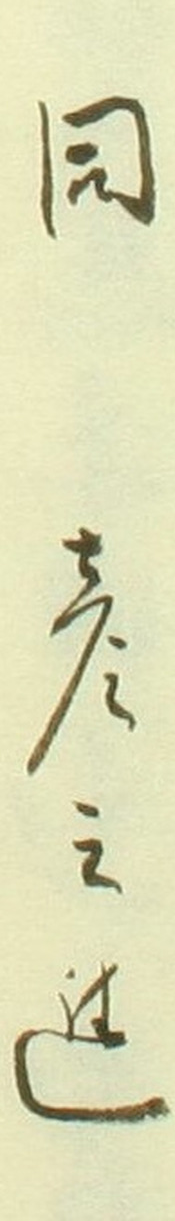同彦之進
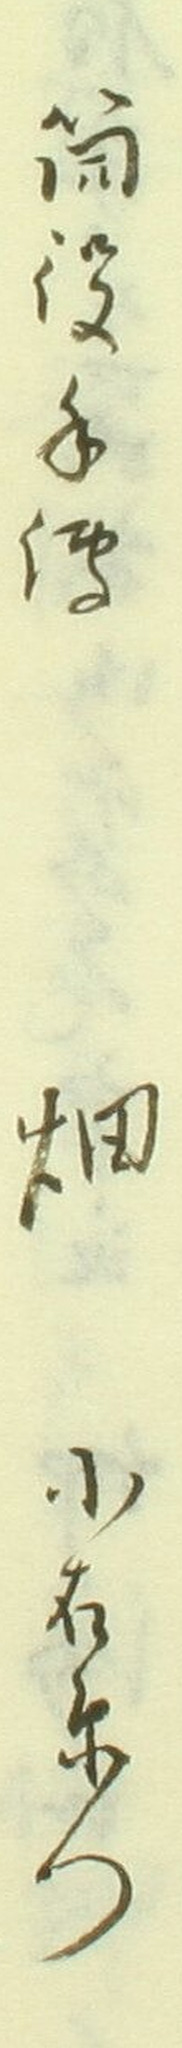筒役手伝畑小右衛門
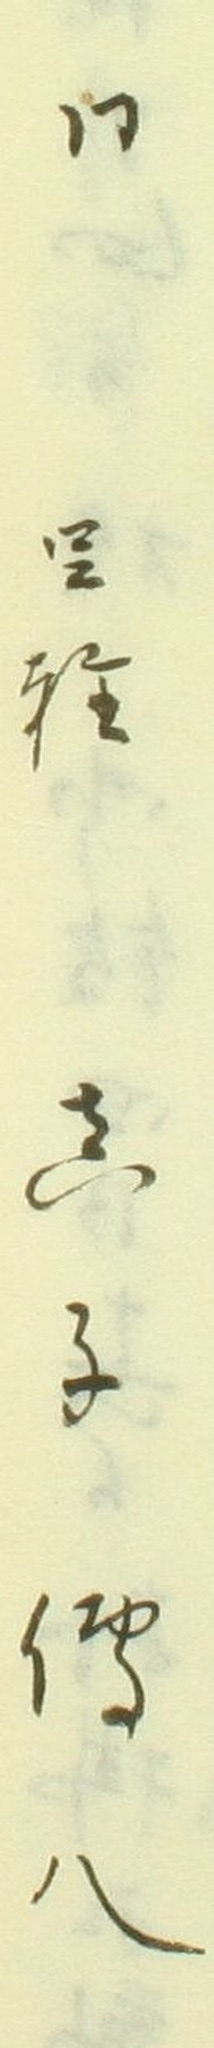同足軽真子伝八
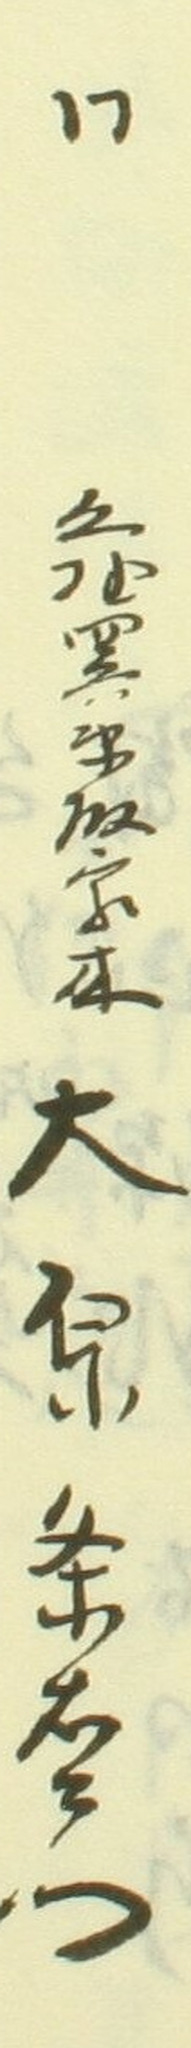同久野？？殿家来大原条右衛門
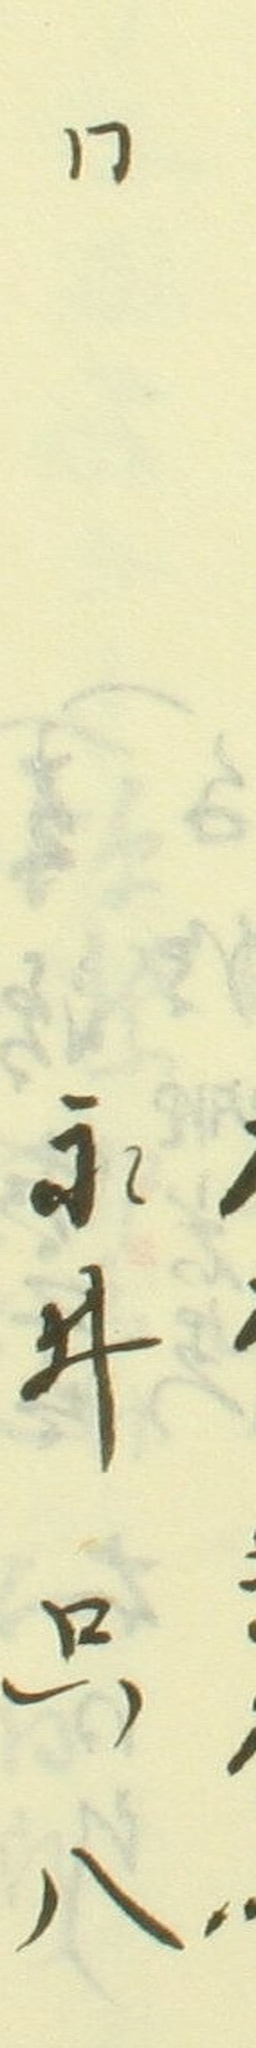同永井只八
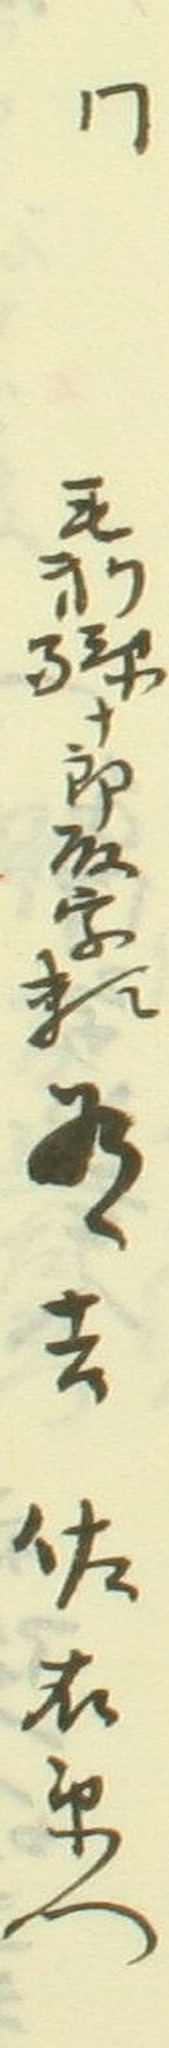同毛利孫十郎殿家頼有吉佐右衛門
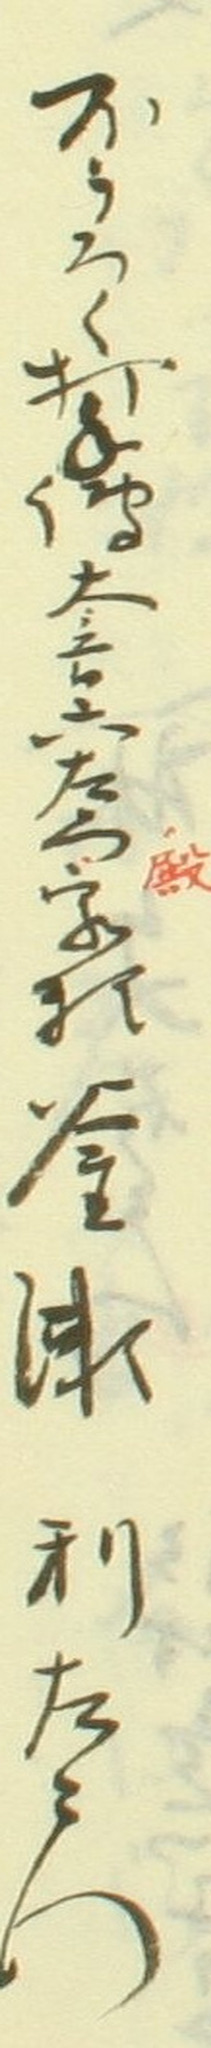不うろく打手伝大音六左衛門家頼釜瀬利左衛門
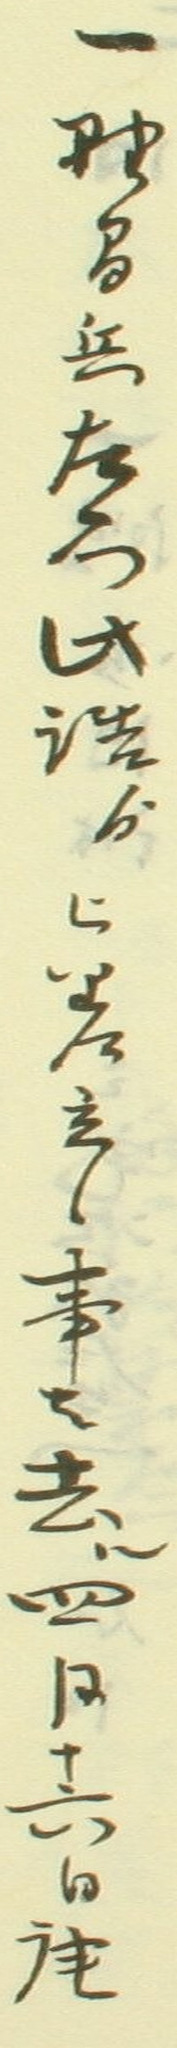一野間兵左衛門此詰ゟ被差立候事は去る四月十六日唐
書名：唐船漂流記 三
